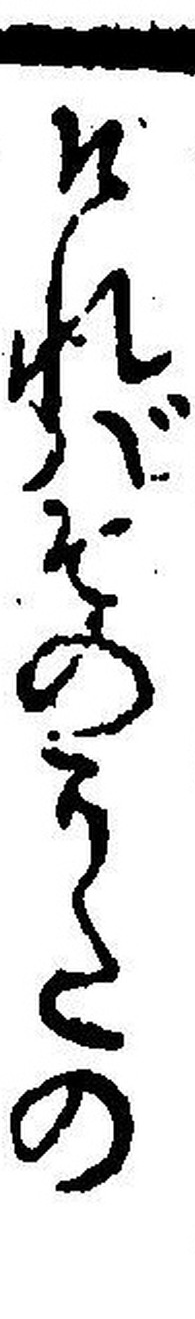ければそのうたの
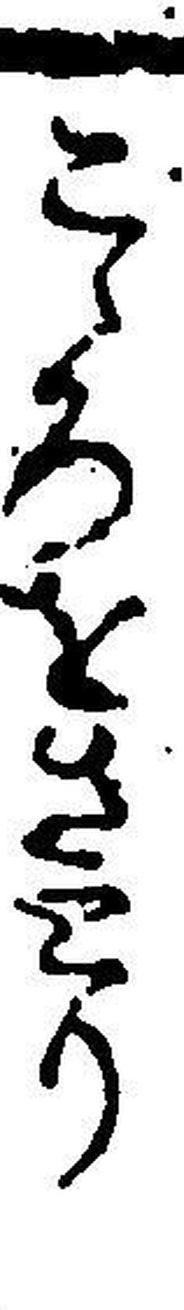こゝろをさとり
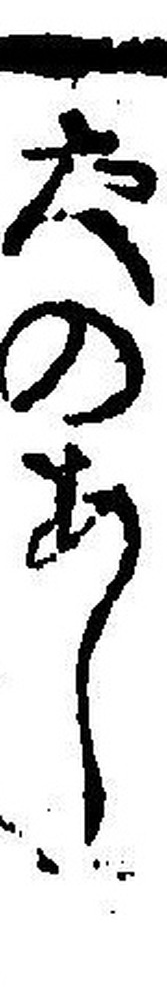犬のあし
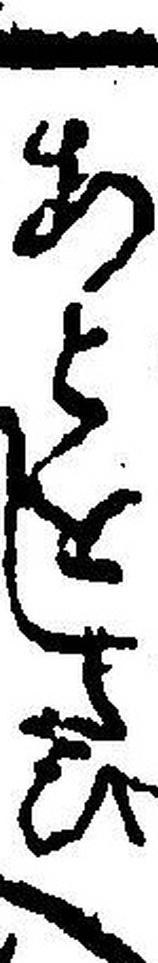あとをしたひ
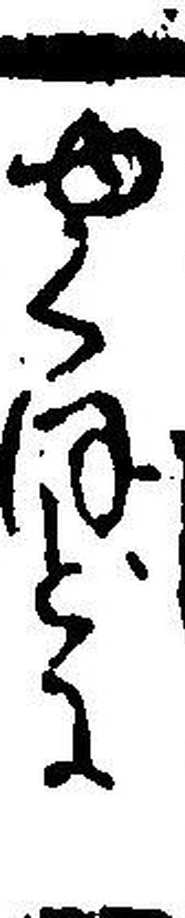ゆくほどに
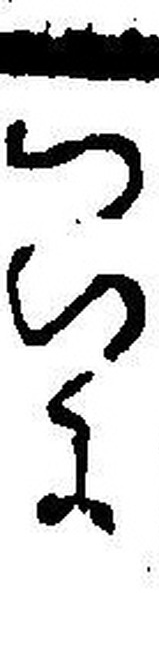ついに
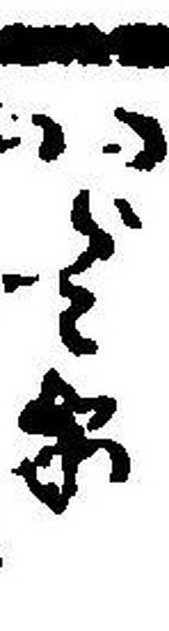八郎兵衛
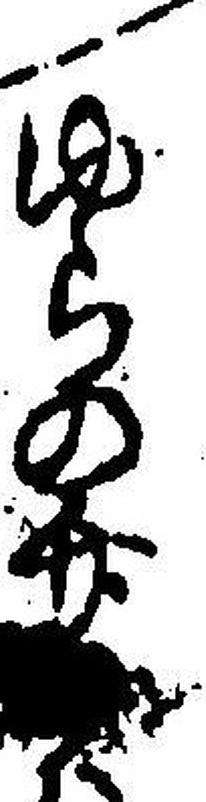ゆらの介
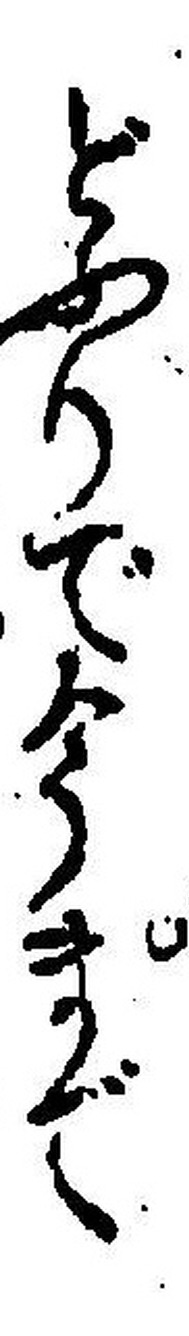どふりで今まで
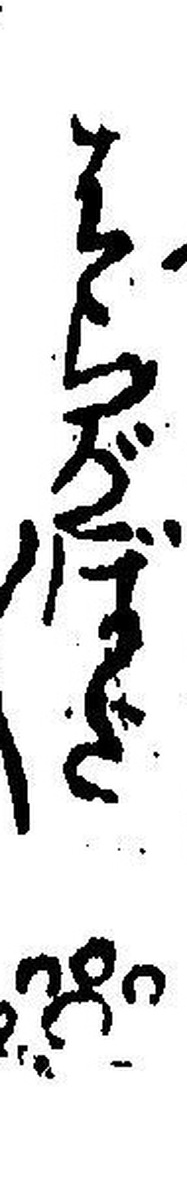はらがぼた
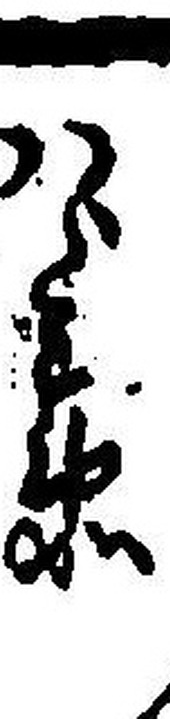八郎兵衛
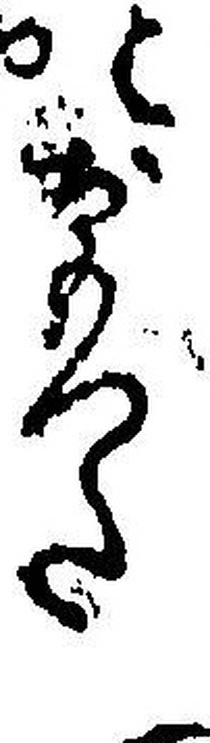おもつた
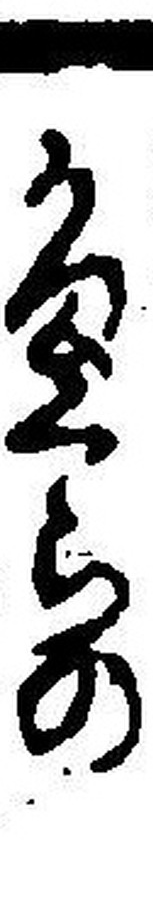かまくらの
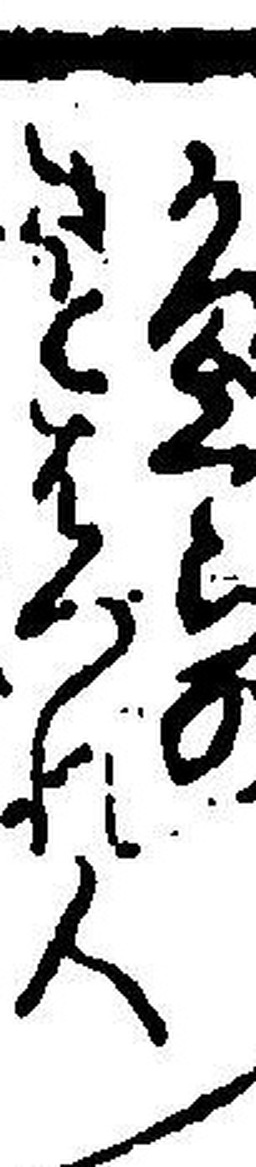さとはづれ人
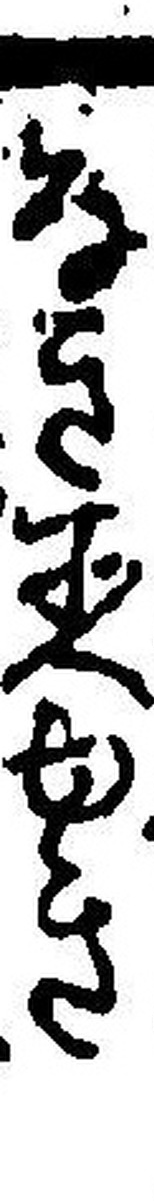なき所へゆき
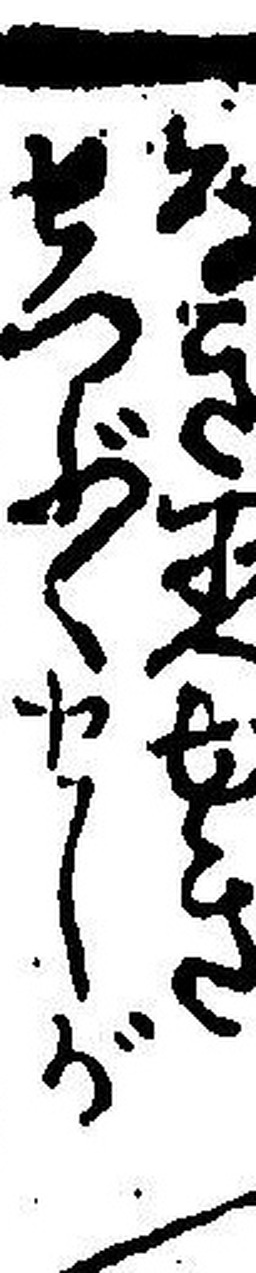せつぶくせしが
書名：花芳野犬斑 / 山東京伝作
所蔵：東京大学総合図書館 General Library in the University of Tokyo, JAPAN
